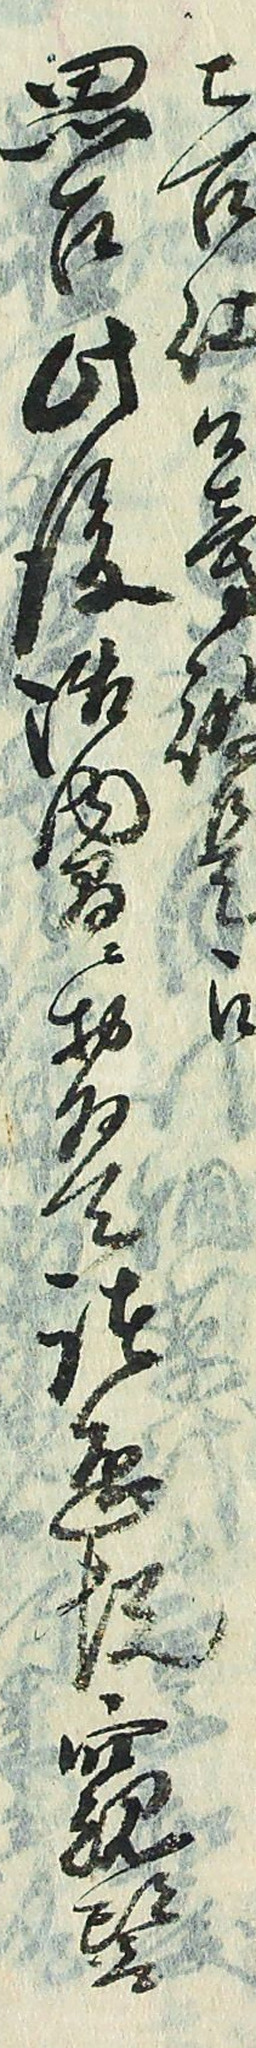思召此後御内間ニおゐて諸恐悦窺頭取
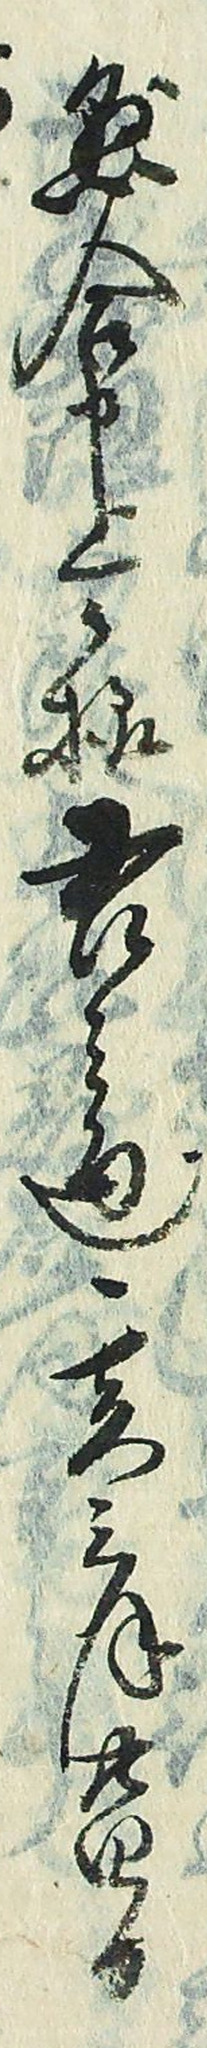懸合申上候様右之通亥三月廿四日
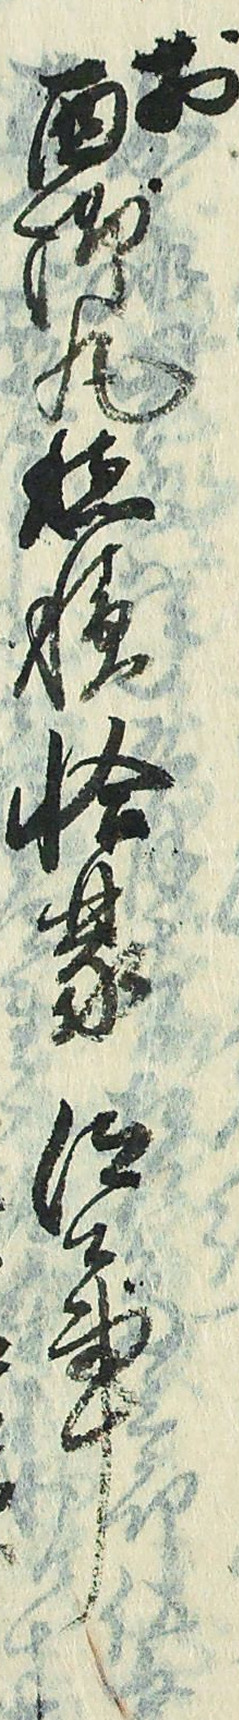西御丸穂積恰蒙仰候事
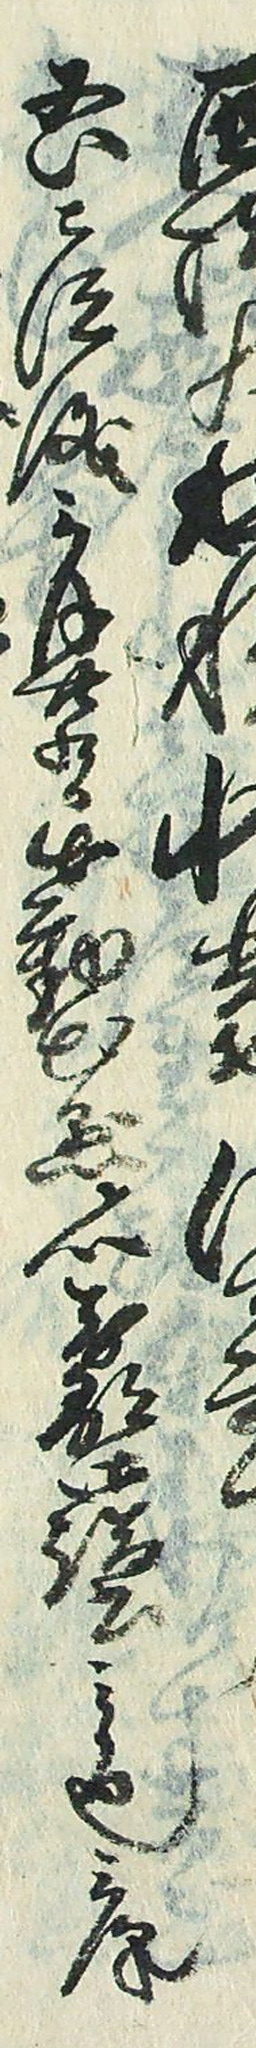右被仰儀三月廿九日出勤出懸ヲ以前顕御端書之通三沢
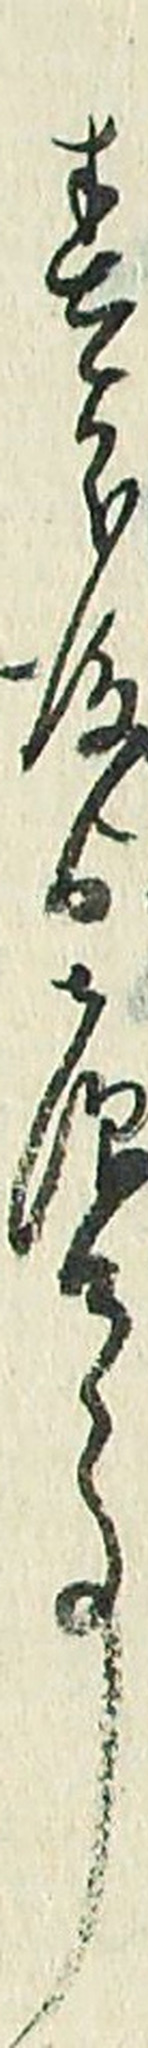春太郎殿ゟ被仰候事

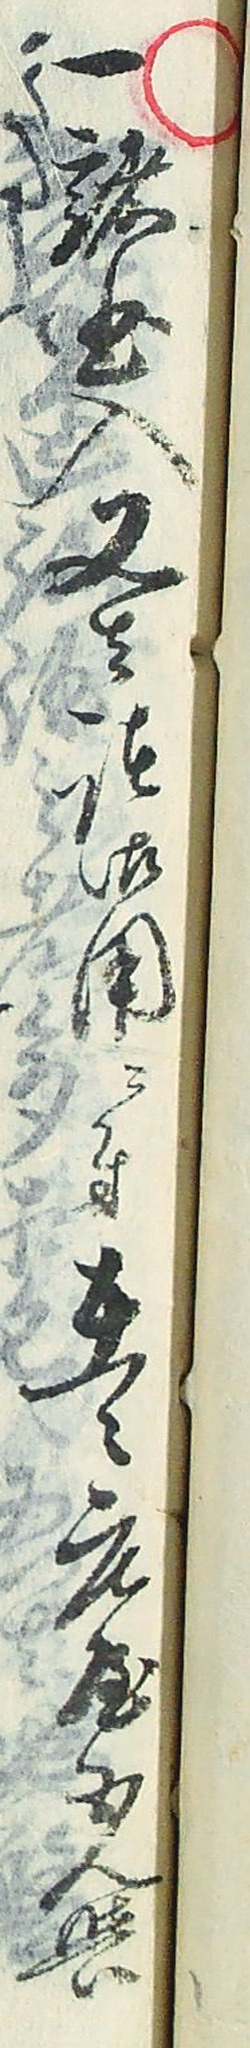一諸書入又者諸御用ニ付在々庄屋五人與
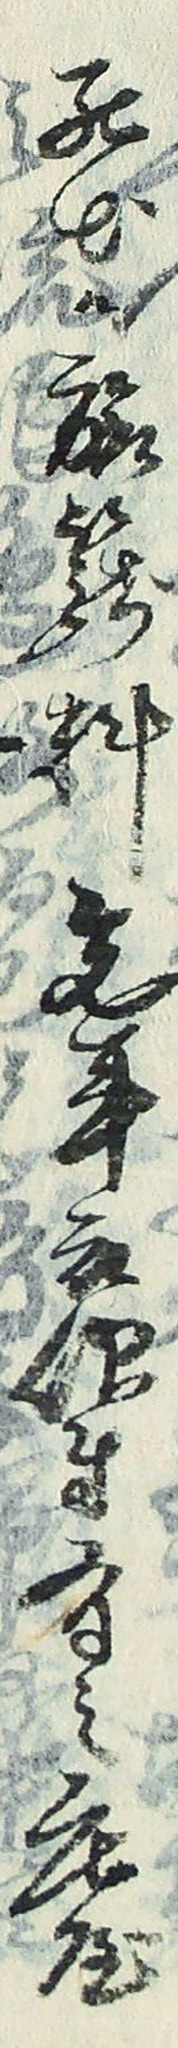罷出候旅籠料先年被仰付有之庄屋
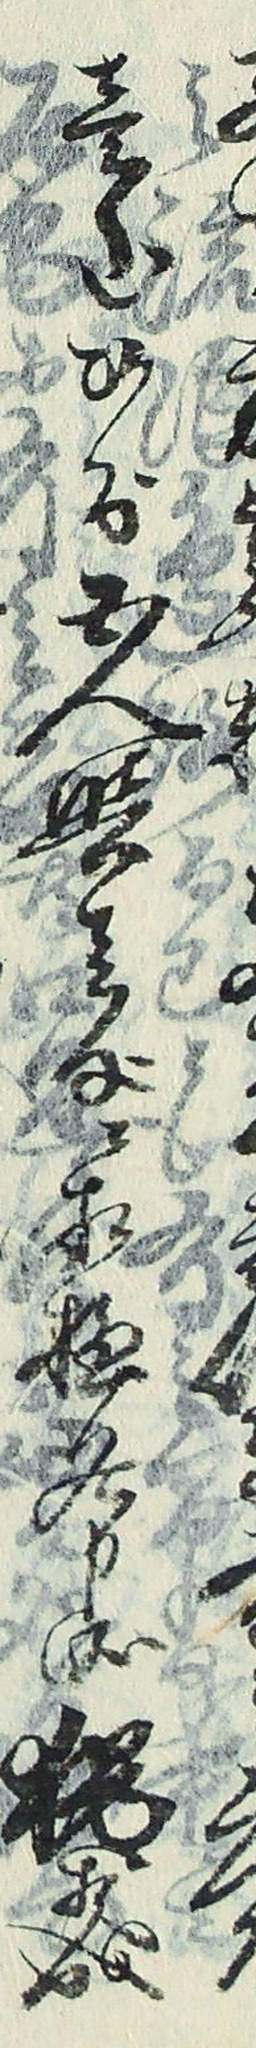壱匁弐分五人與壱匁ニ相極居申所猥相成
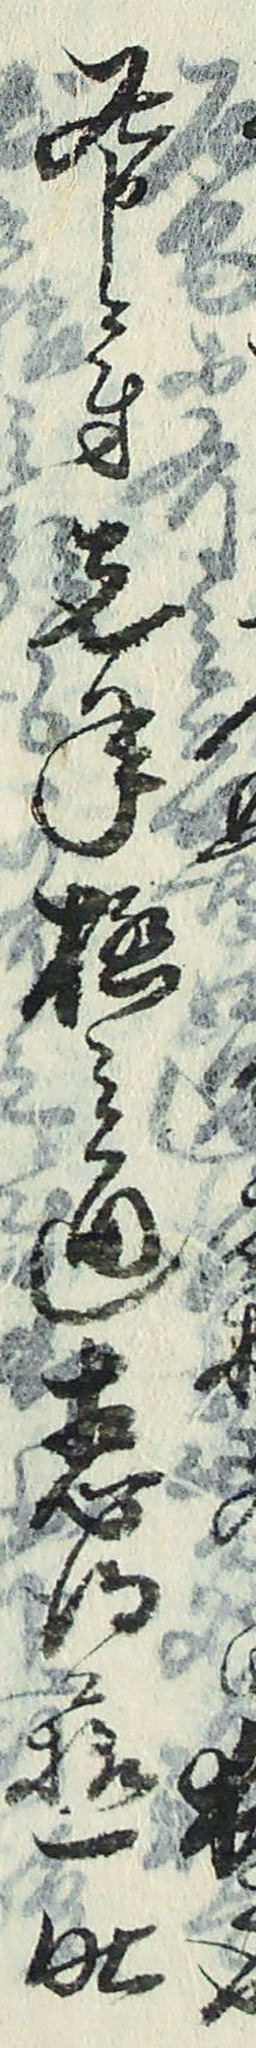居申ニ付先年極之通相心得候様一昨
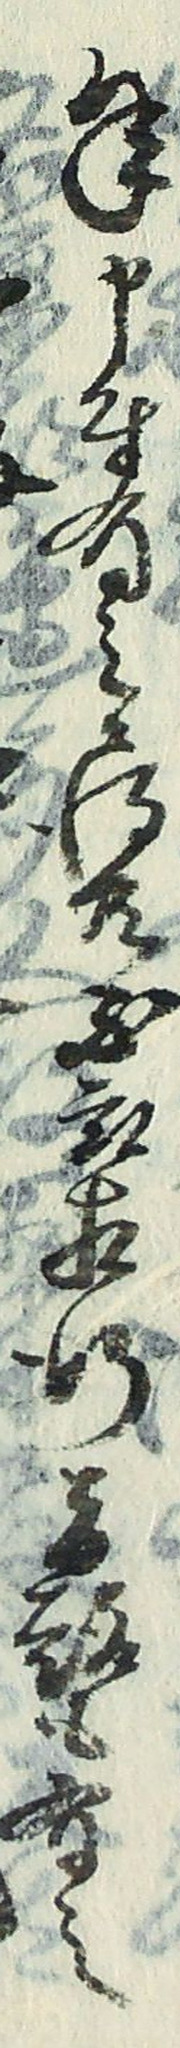年申付有之ニ候得共不被相行旨趣も有之
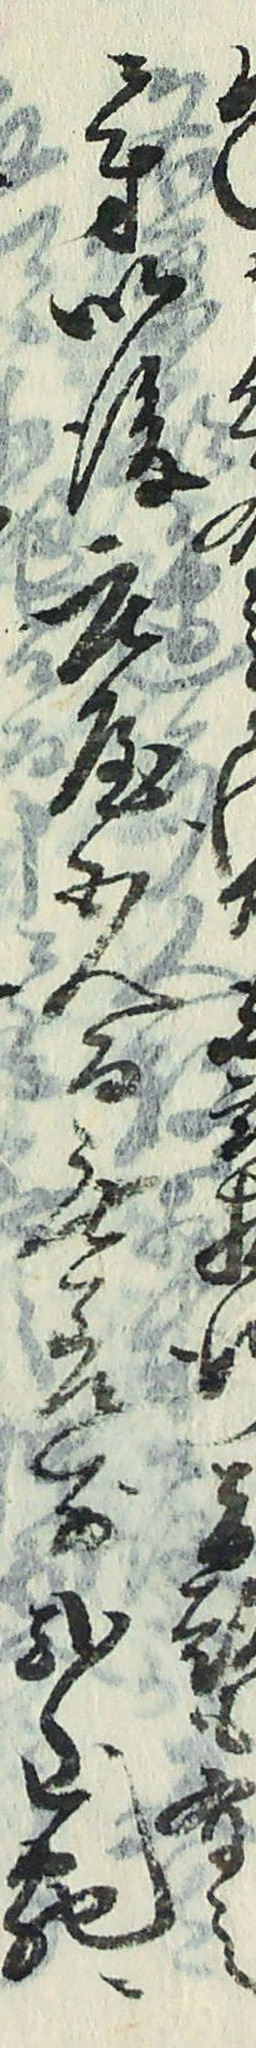ニ付以後庄屋五人与無差別弐匁宛ニ
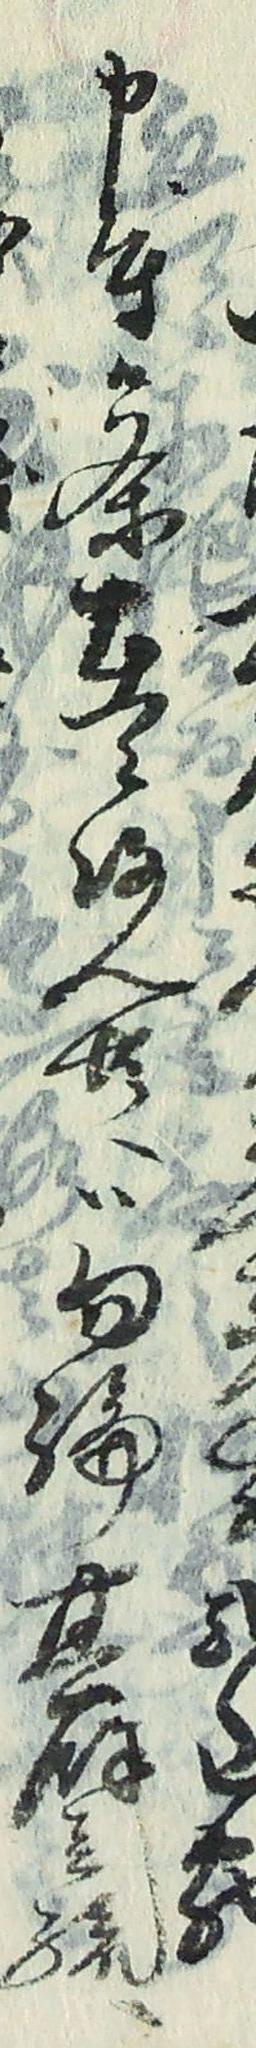申付候条在々役人共へハ勿論其餘壱統へ
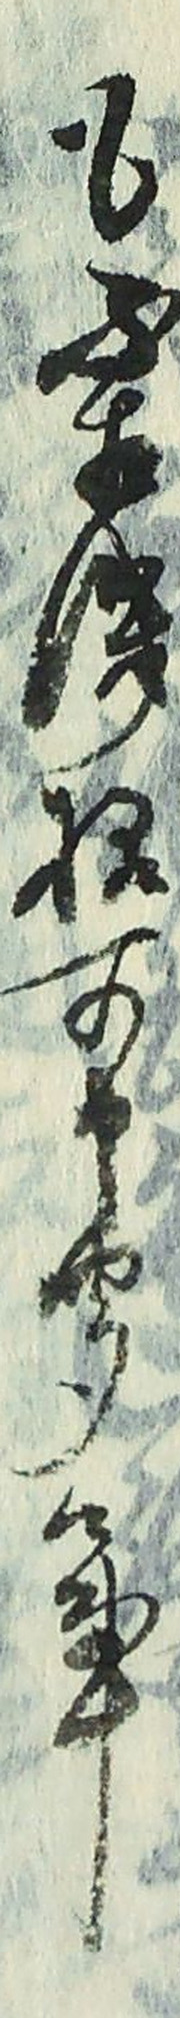も不相洩様可申聞候事
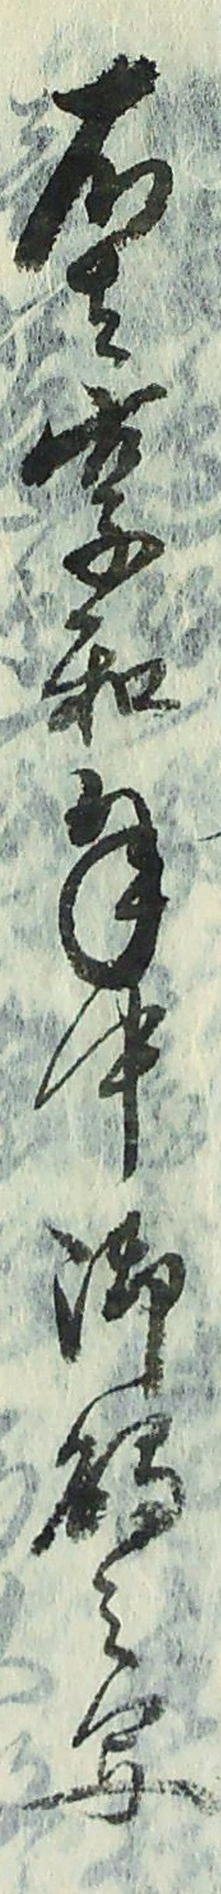右者享和年中御觸之写
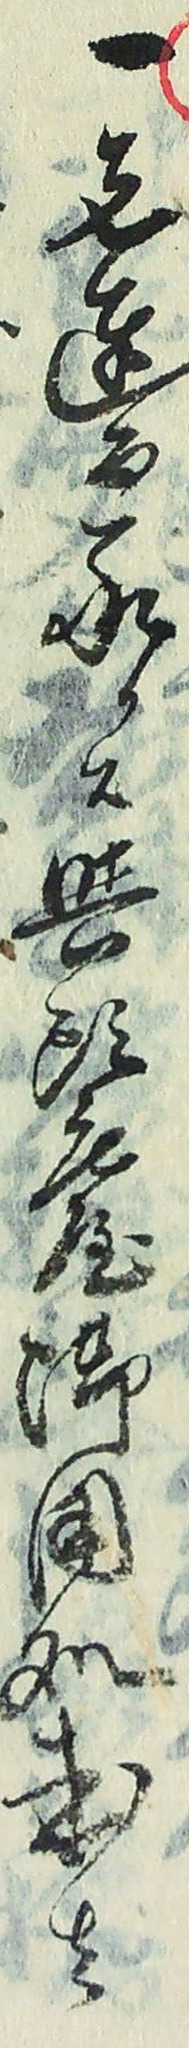一先達而承り候與頭庄屋御用処成者
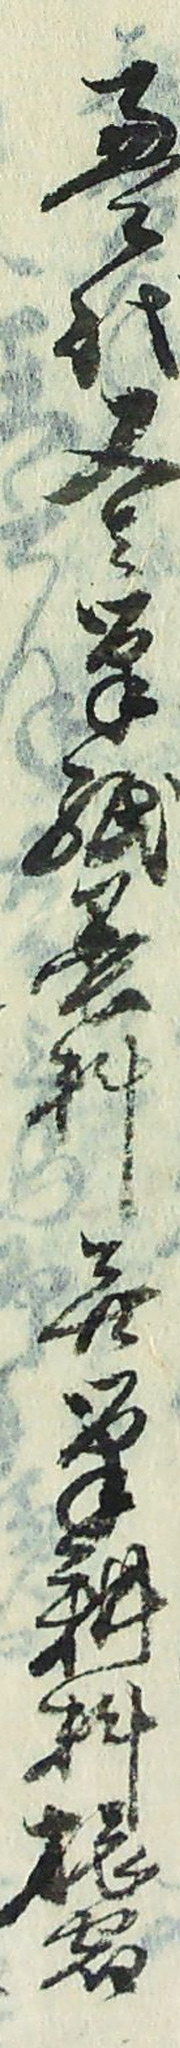畳代又者筆紙墨料幷筆耕料旅宿
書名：諸御趣意書并御下知向之写
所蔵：鳴門教育大学 Naruto University of Education
